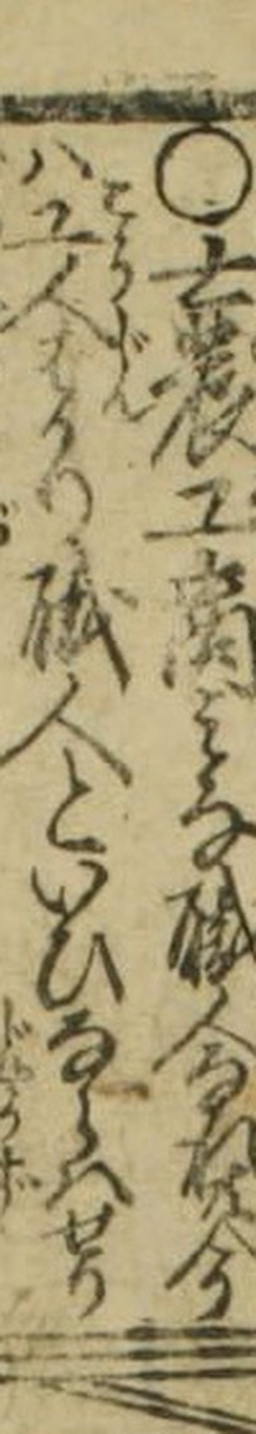は工人ばかり職人といひならはせり
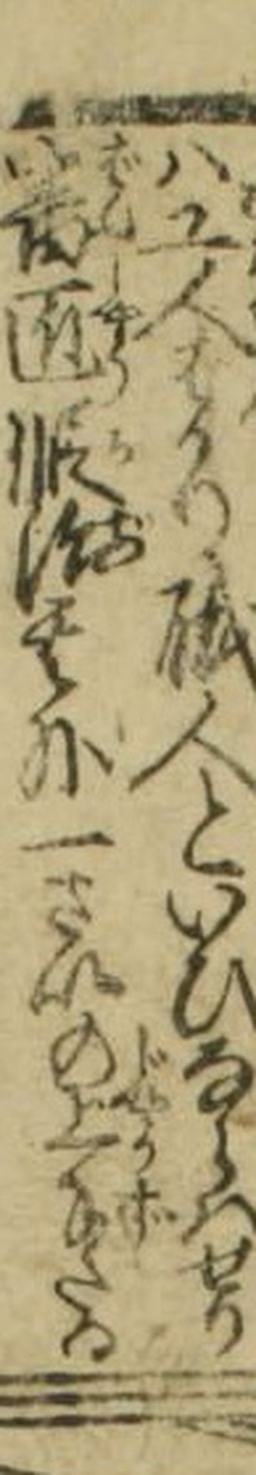番匠鍛冶其外一さいの上手たる
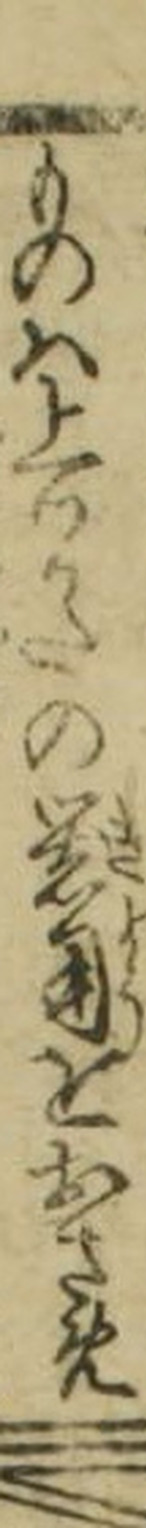ものは上つかたの器用をおさめ
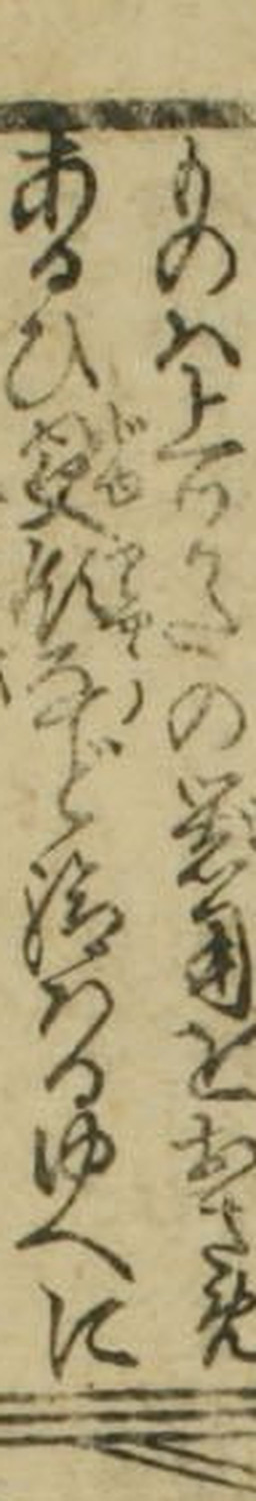あるひは受領など給はるゆへに
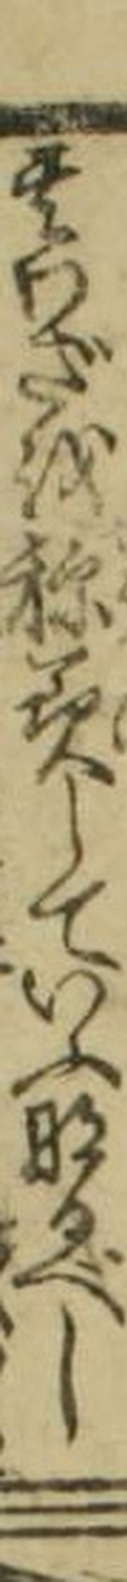其わざを称美していふなるべし
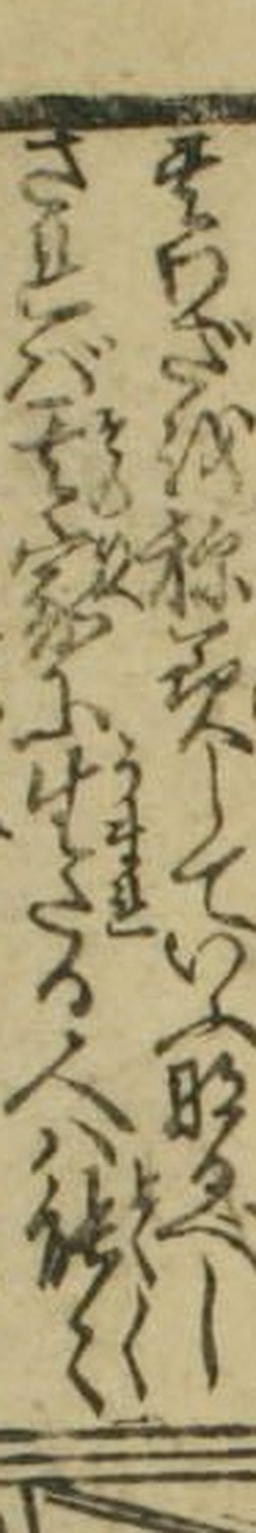されば其家に生たる人は能々
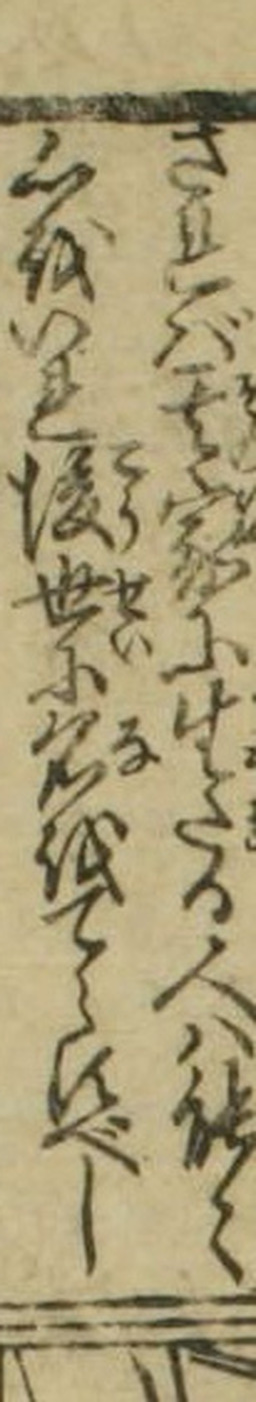心をいれ後世に名をてらすべし
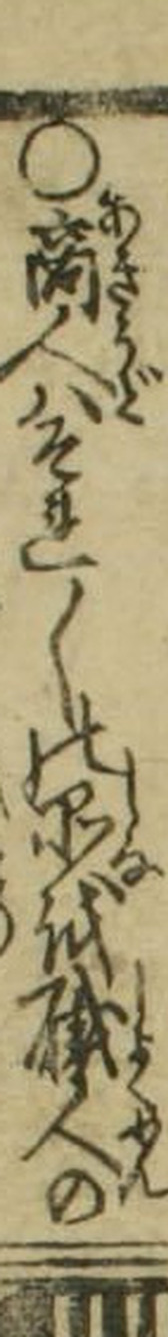○商人はそれ〳〵の品を職人の
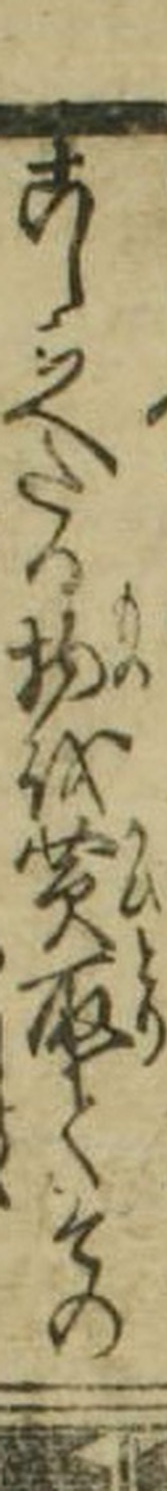こしらへたる物を買取てその
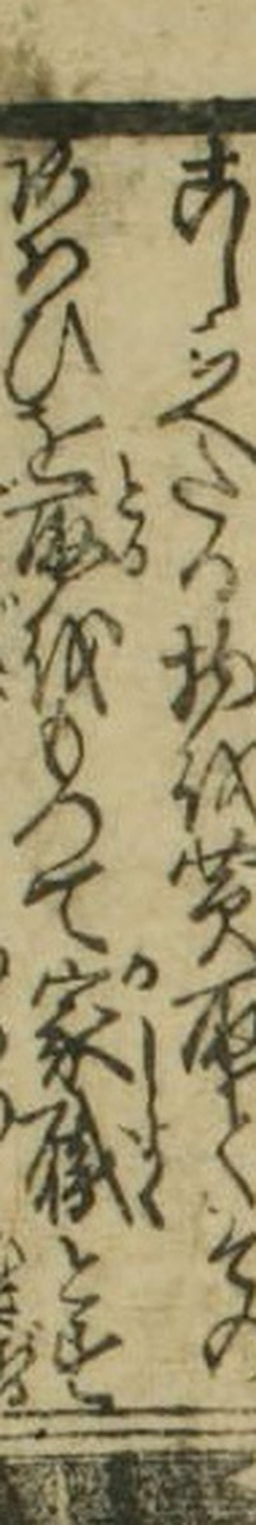あはひを取をもつて家職とす
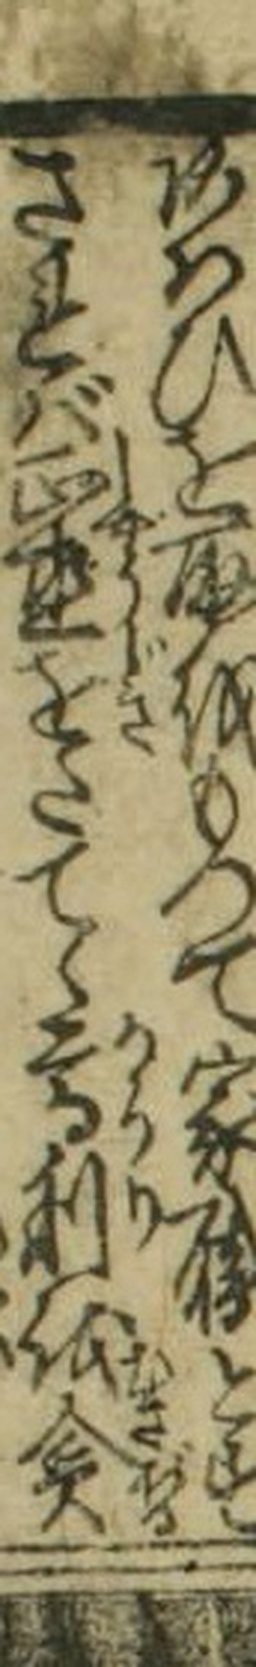されば正直をたてゝ高利を貪
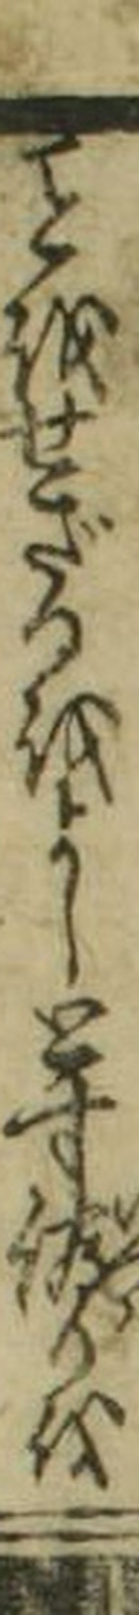ことをせざるをよしとす偽りを
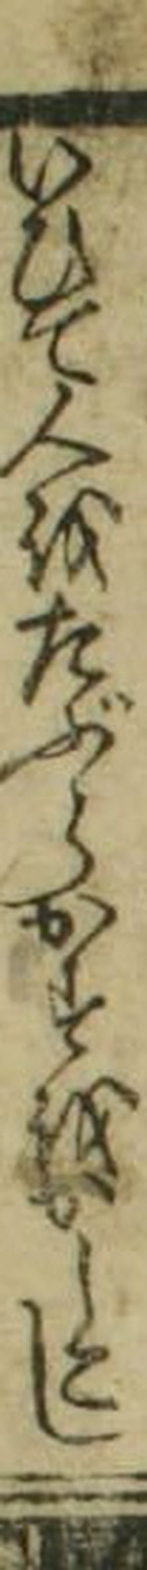いひて人をたぶらかすをかしこし
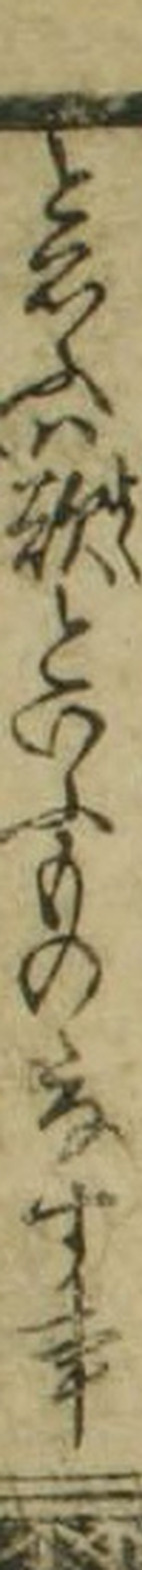と思ふは欲といふものゝなす事
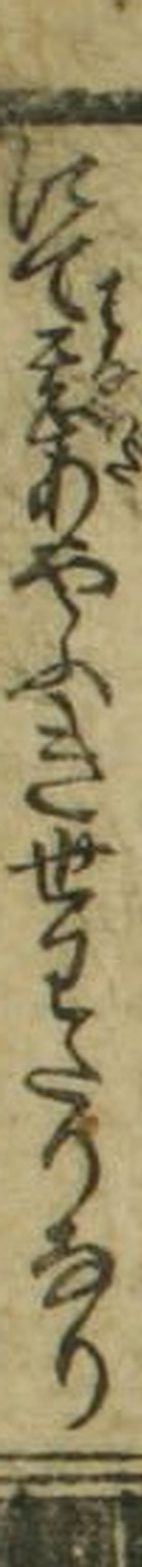にて甚あやふき世わたりなり

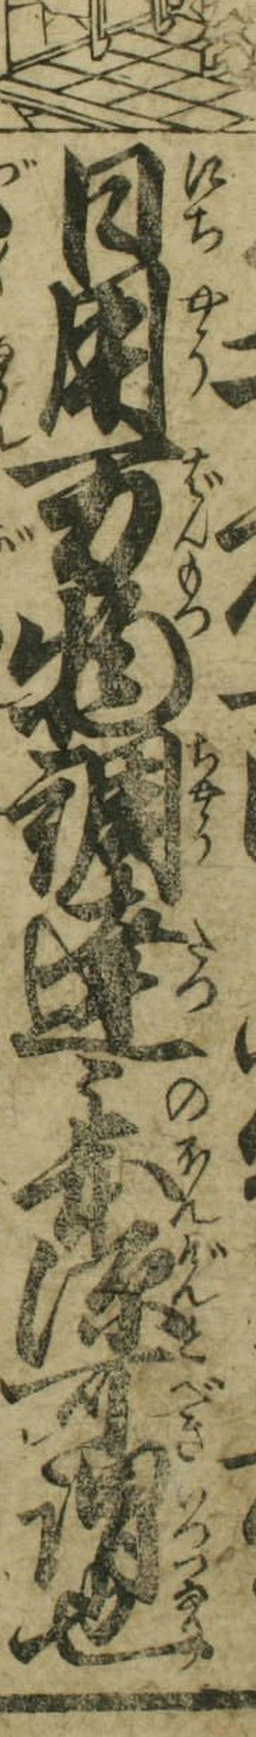日用万物調達之本源可謂也
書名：増補職人往来
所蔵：東京学芸大学教育コンテンツアーカイブ
